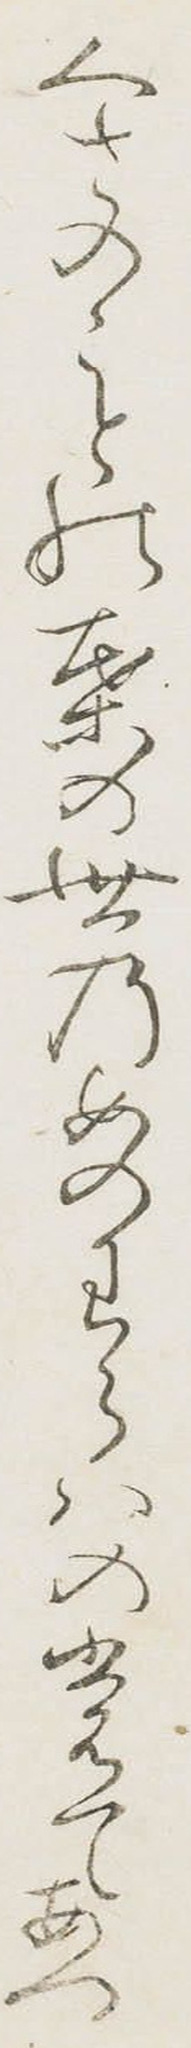くさのことの葉の世のめのわらはのもてあつ
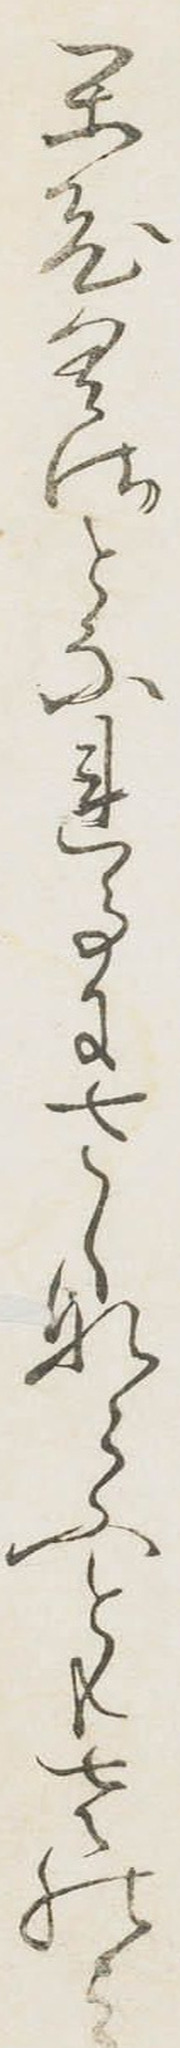かひくさとなれるにさしならふともさのみ
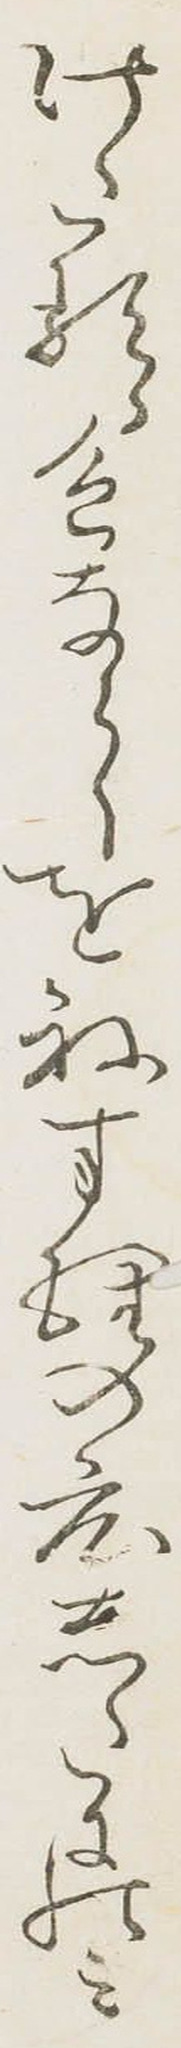けたるゝ色ならしをねすりの衣したにのみ
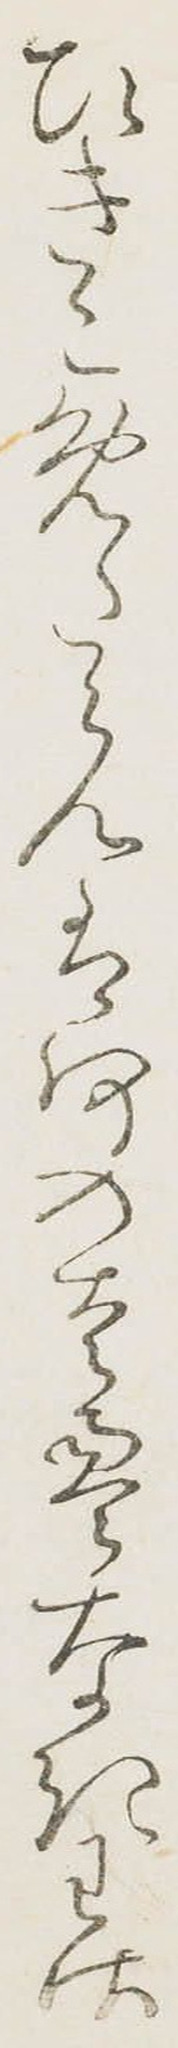ひきこめたらんは何のはえなきわさ
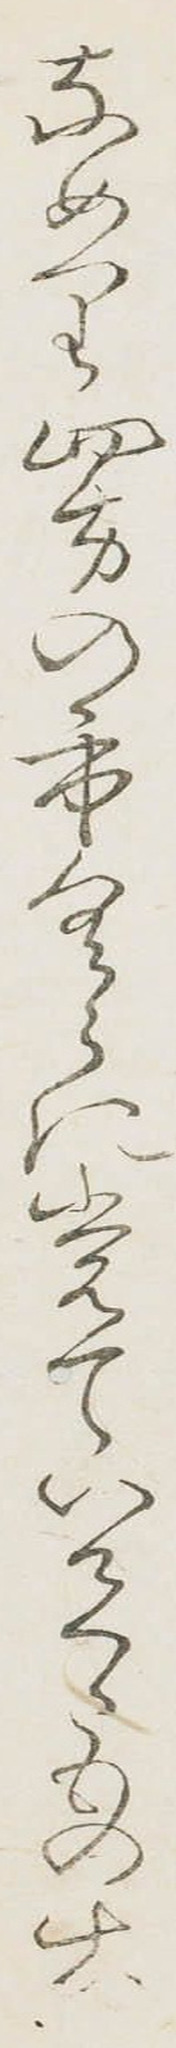なめり四方の市くらにもていてゝものこ
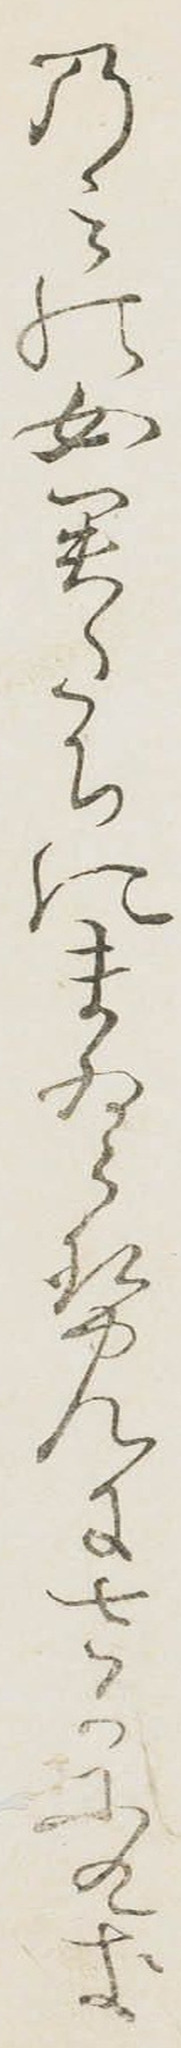のみの女君たちにまゐらせんにさかにくき
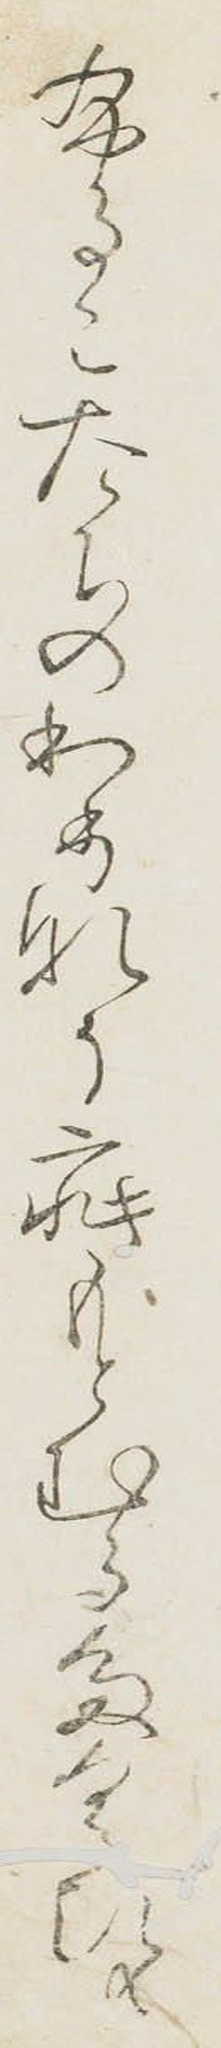ふるこたちのわりなう疵もとむるたくひも
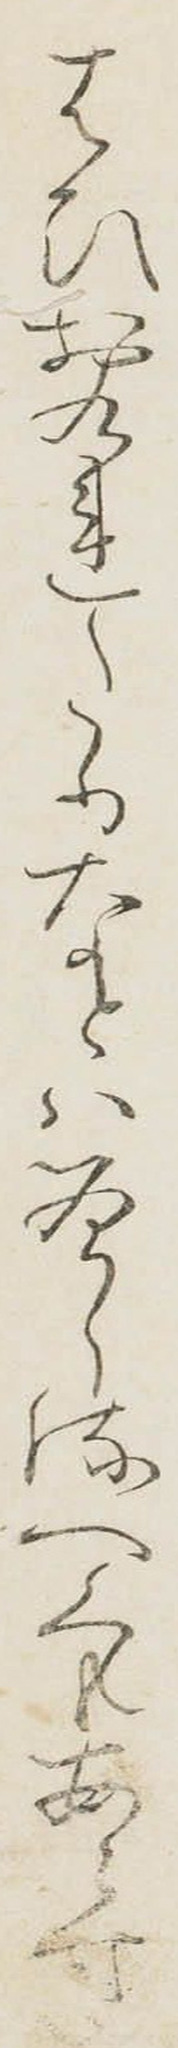はひおくれたりなとはゐくるへくもあらす
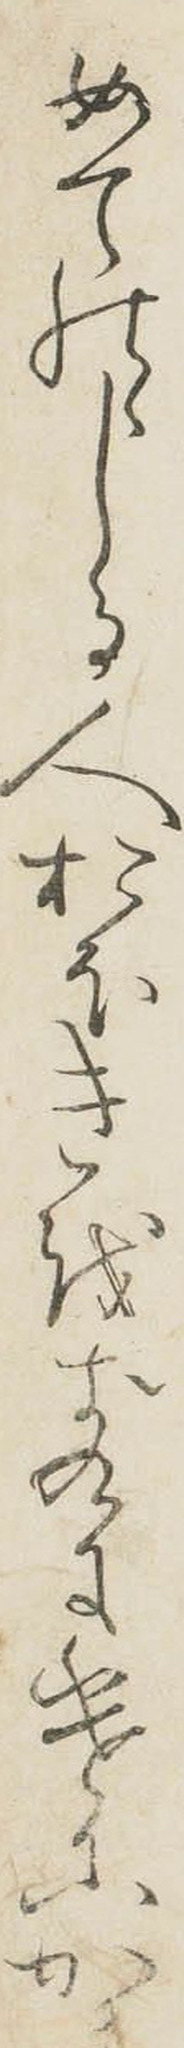めてのゝしる人おほきをきくにけにかうめ

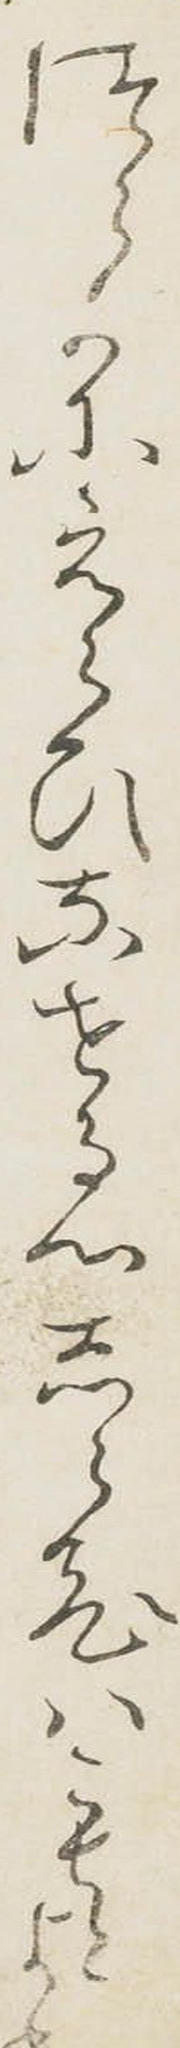つらかにえらひなせる心しらひはもとより
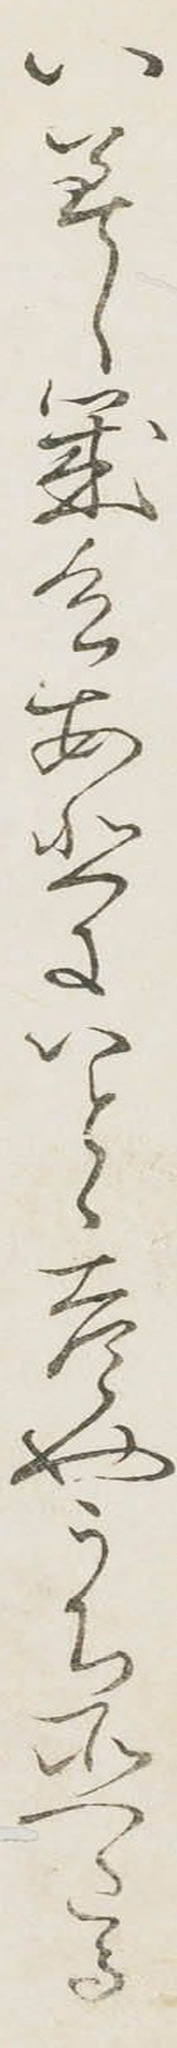いみしき色あひにいとゝつやうちそへたる
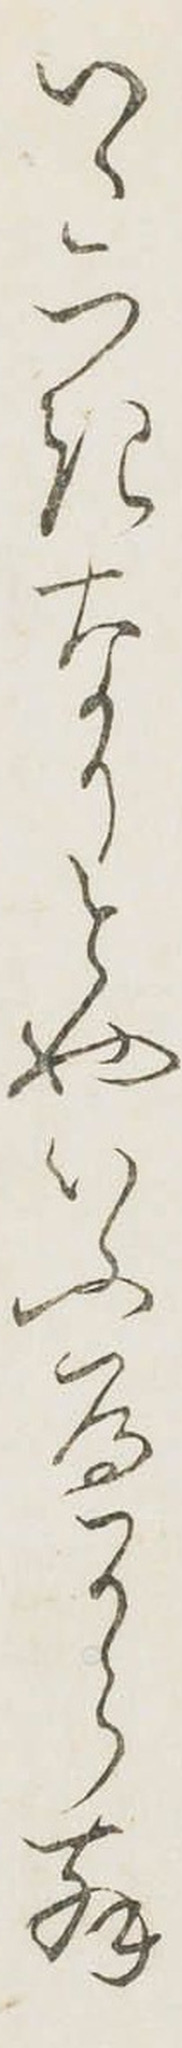いたつきなりとやいふへからむ
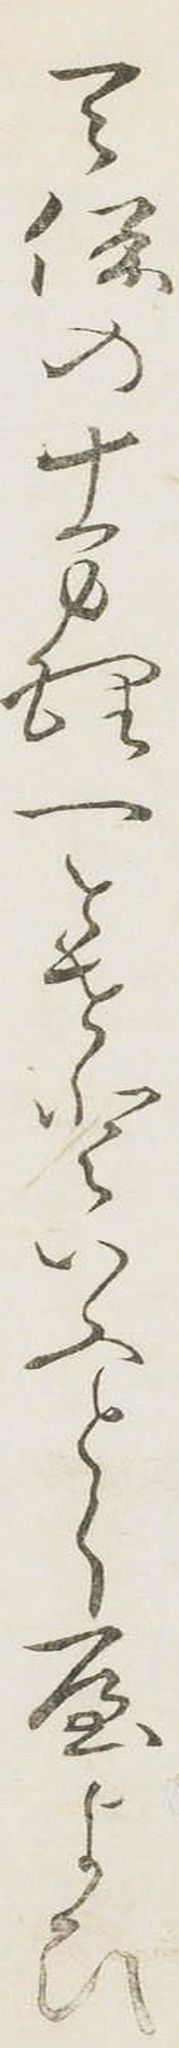天保の十万理一とせといふとしやよひ
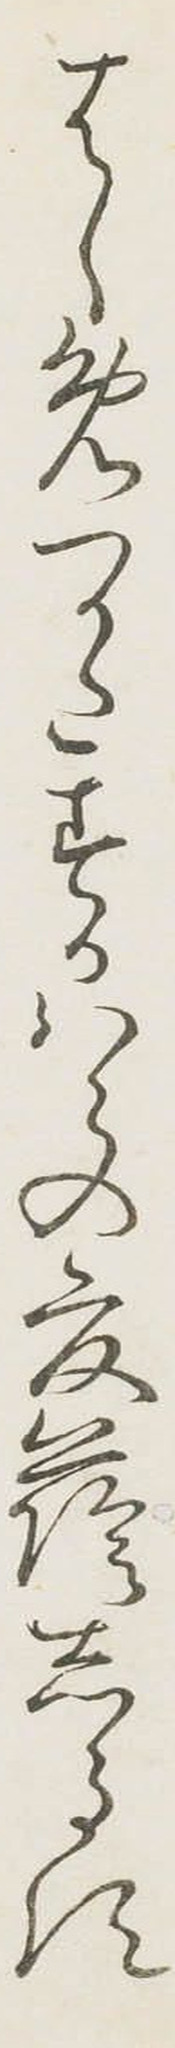はしめつかたすかはらの夏蔭しるす
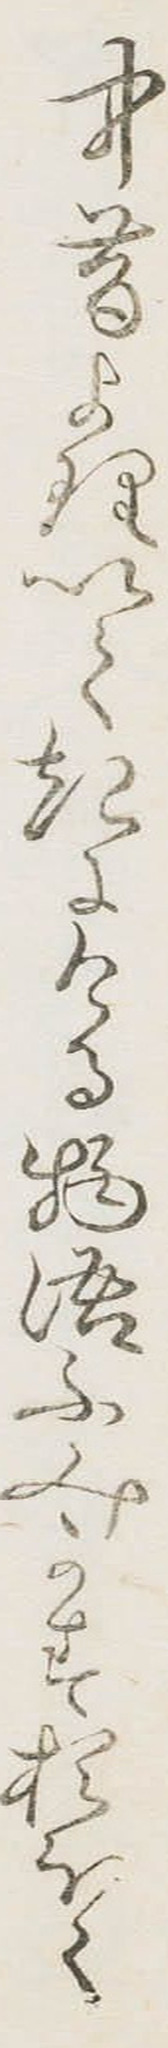中昔よりいてきにける物語ふみかすおほく
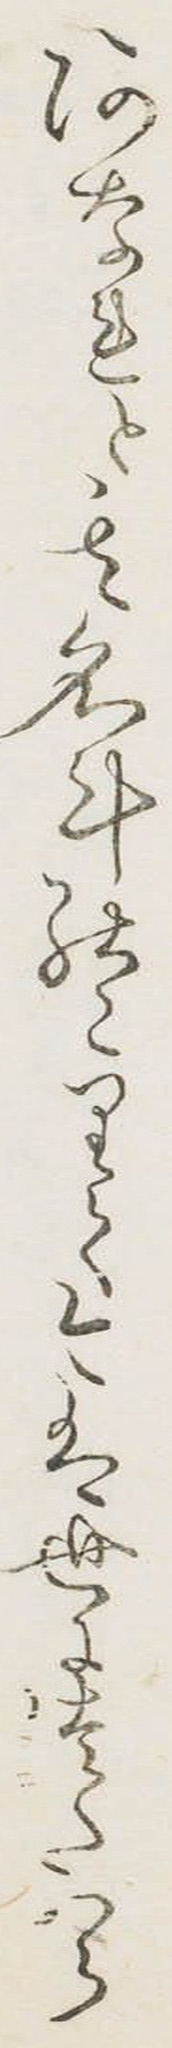あなれと其名計のこりて今は世につたはら
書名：源氏百人一首
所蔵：東京学芸大学教育コンテンツアーカイブ
